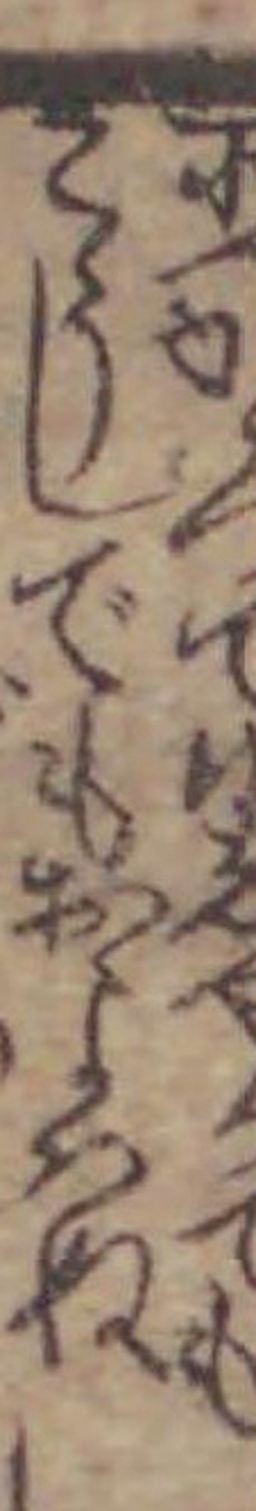こうしでもおよはぬ
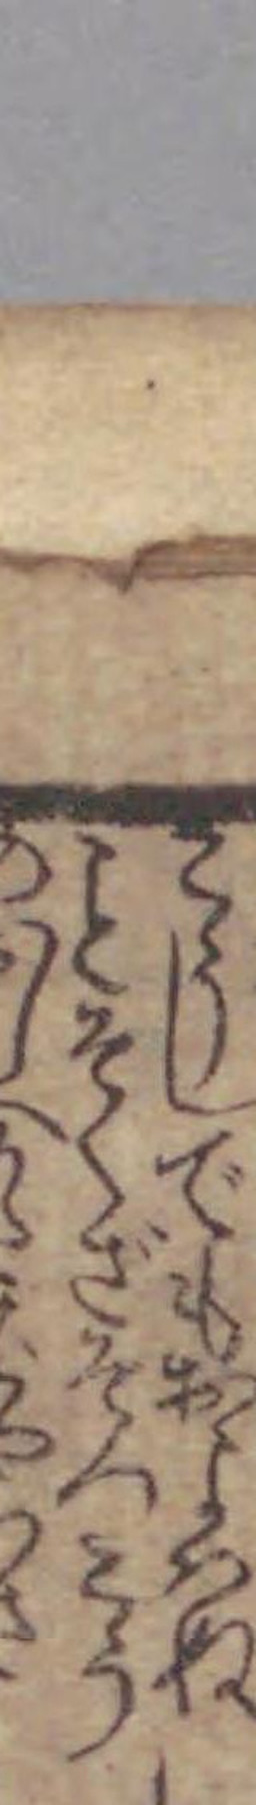ことそくざそつこう
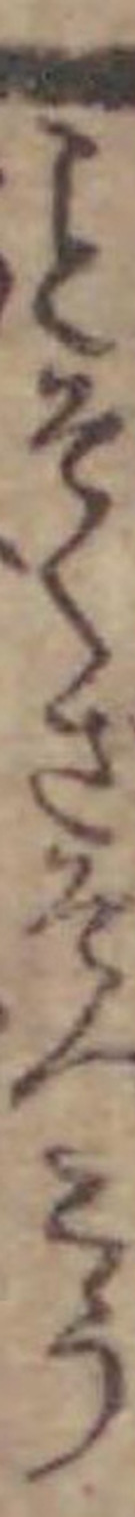ことそくざそつこう
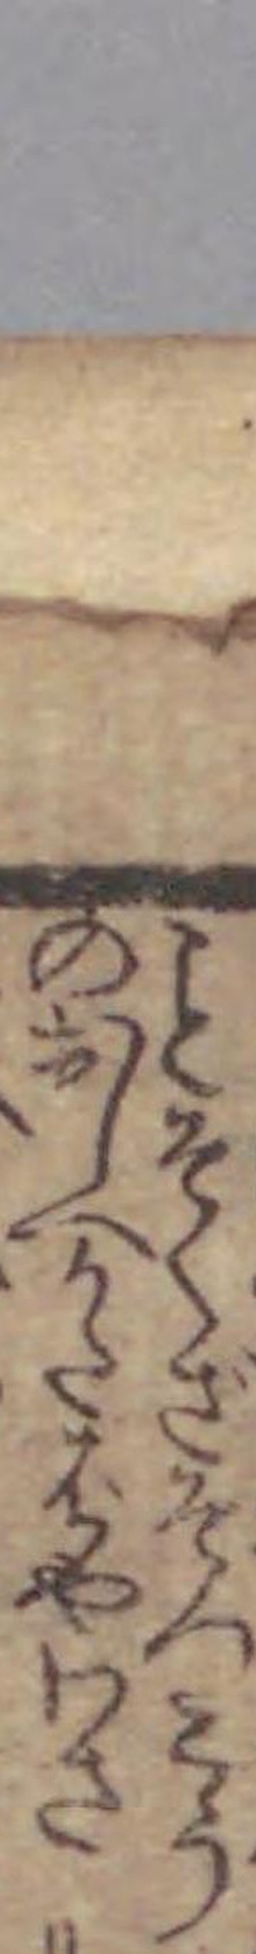のおしへかたはやわさ
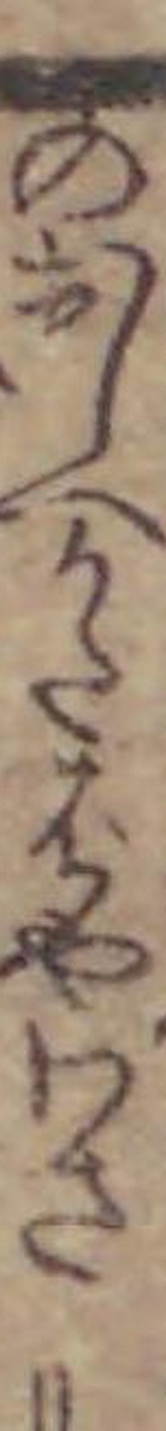のおしへかたはやわさ
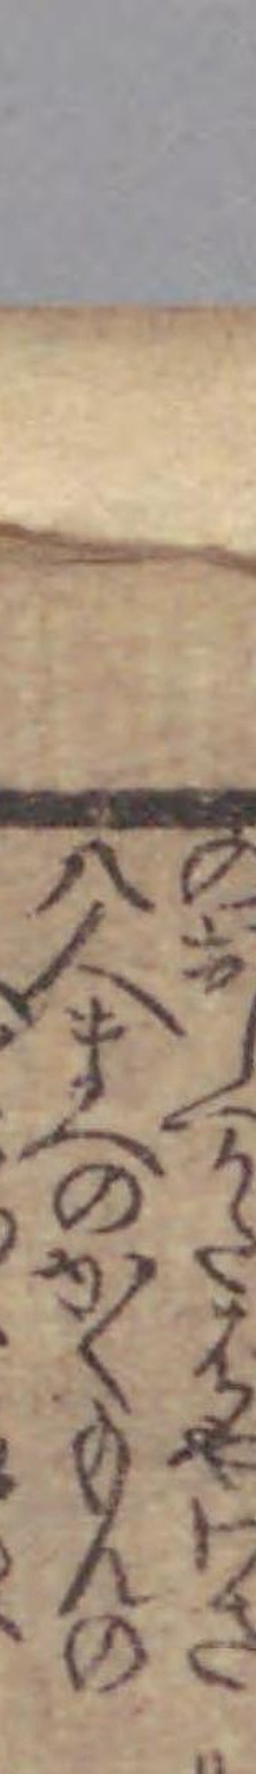八人まへのかくもんの
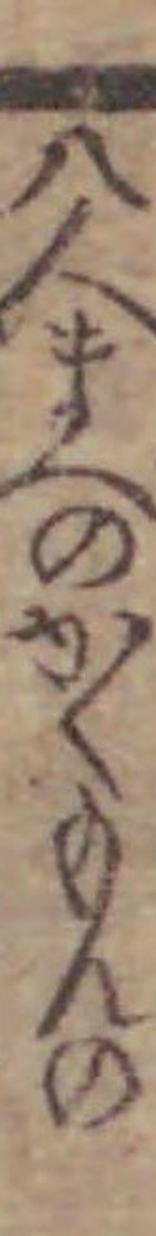八人まへのかくもんの
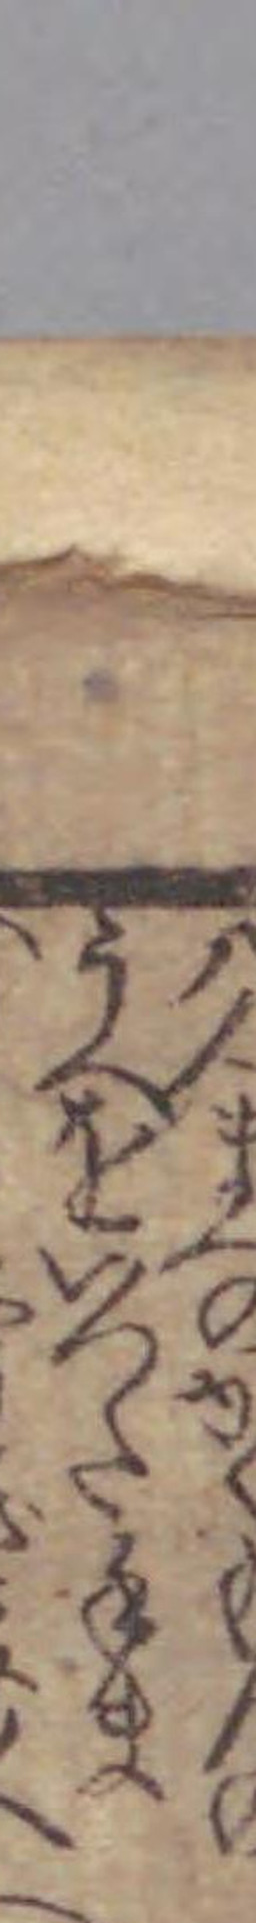うへをいつた手ま
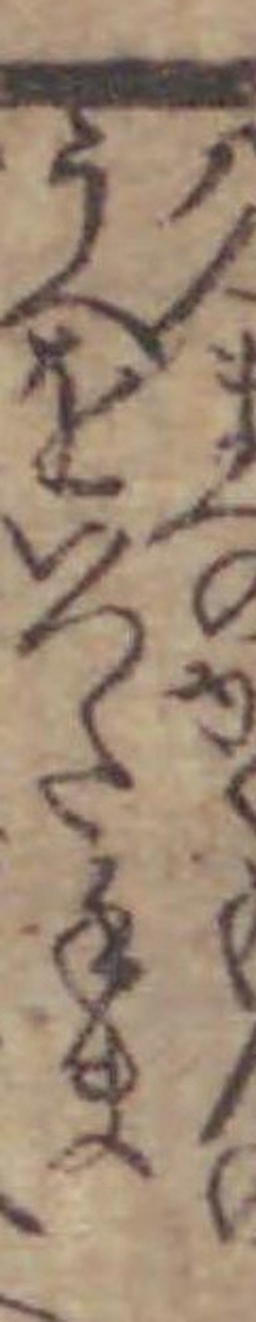うへをいつた手ま
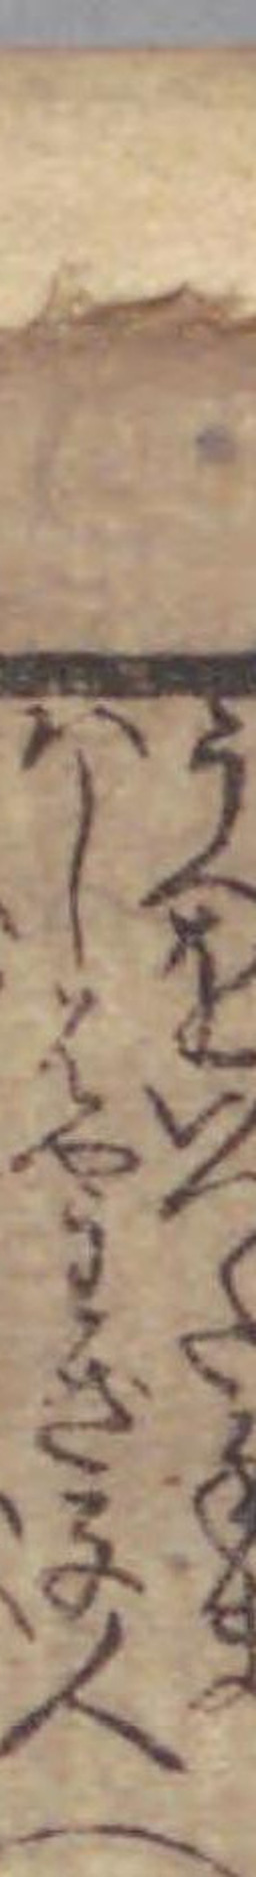はしはやわざ千人
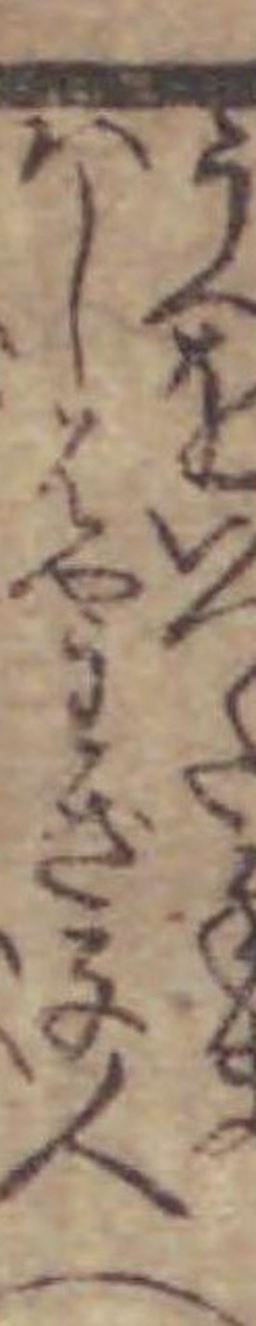はしはやわざ千人
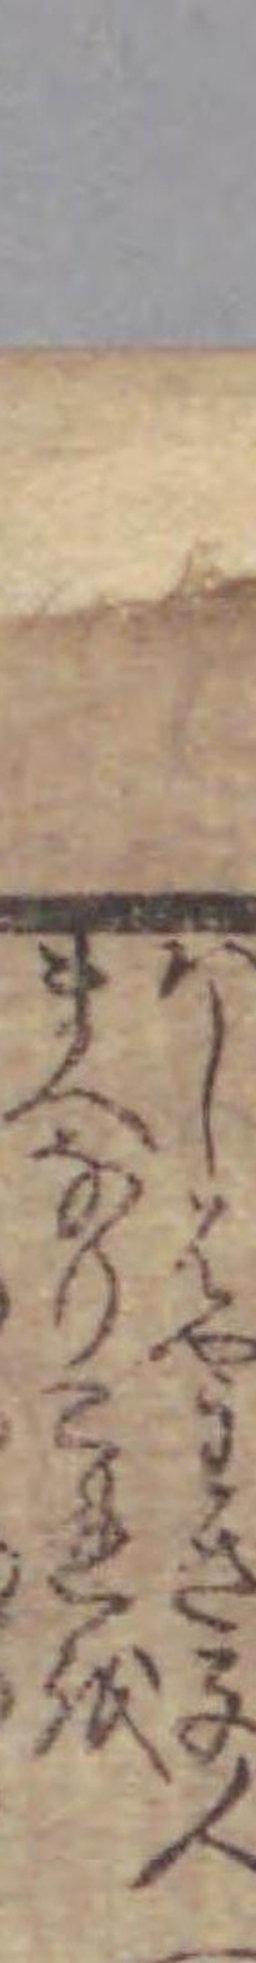まへなりこれを
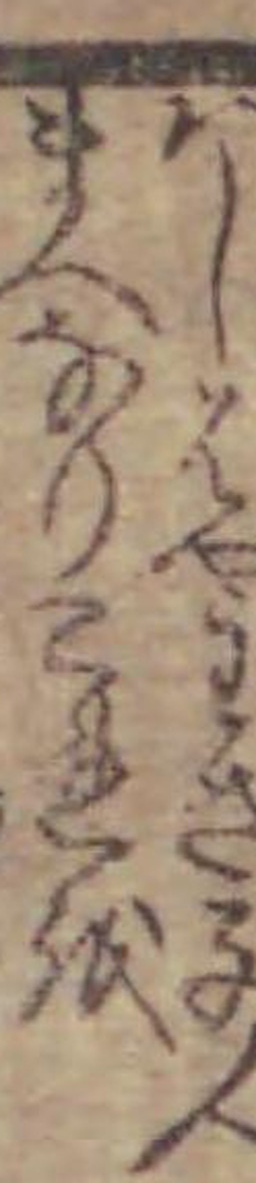まへなりこれを
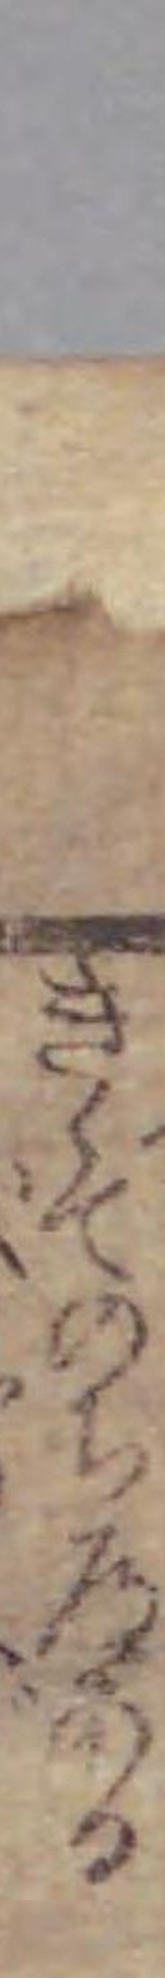きゝてのち道ある
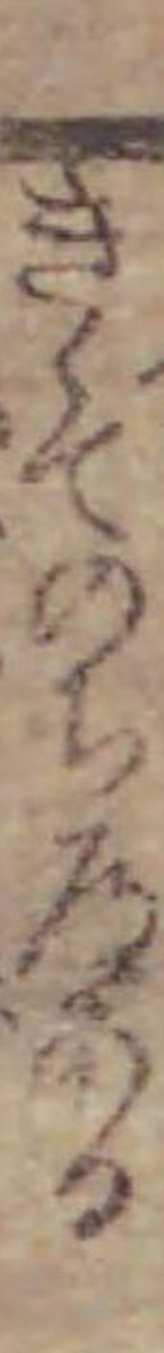きゝてのち道ある
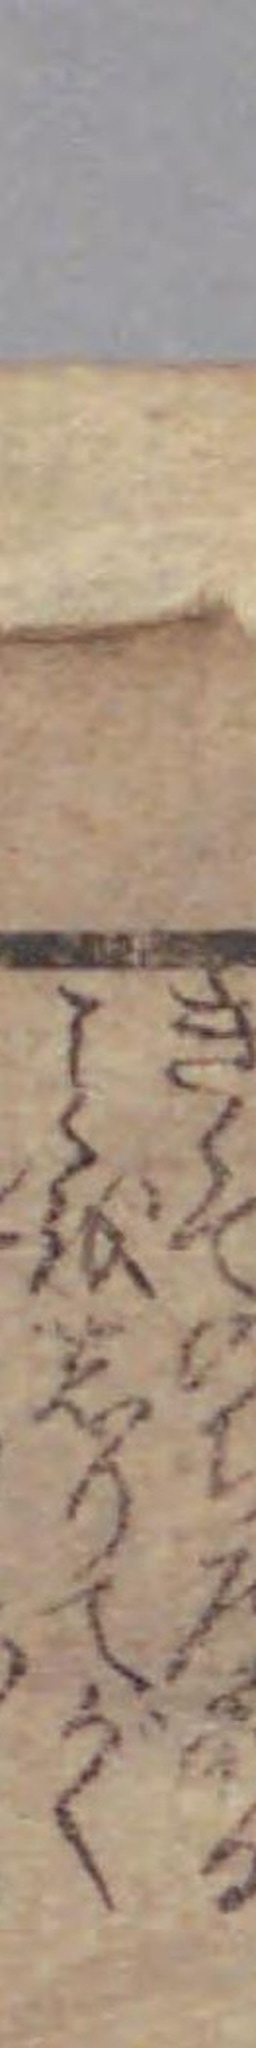ことをしりてがく
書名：即席耳学問 : 3巻
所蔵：国立国会図書館 National Diet Library, JAPAN
